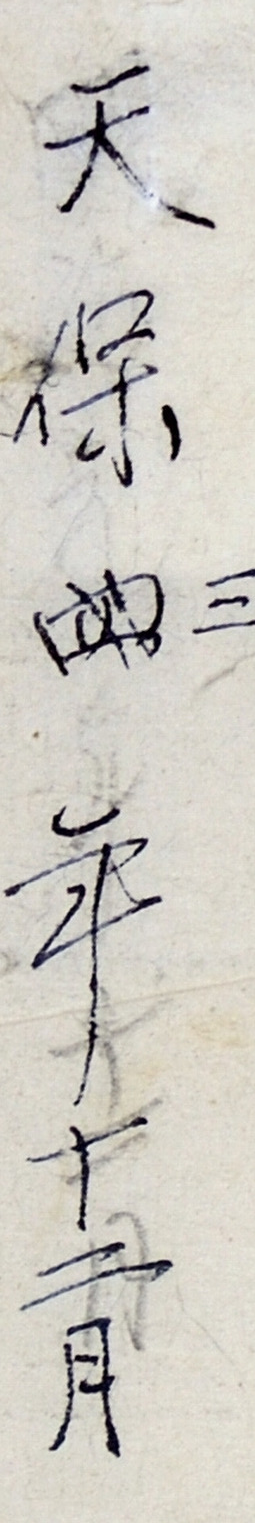天保四年十二月
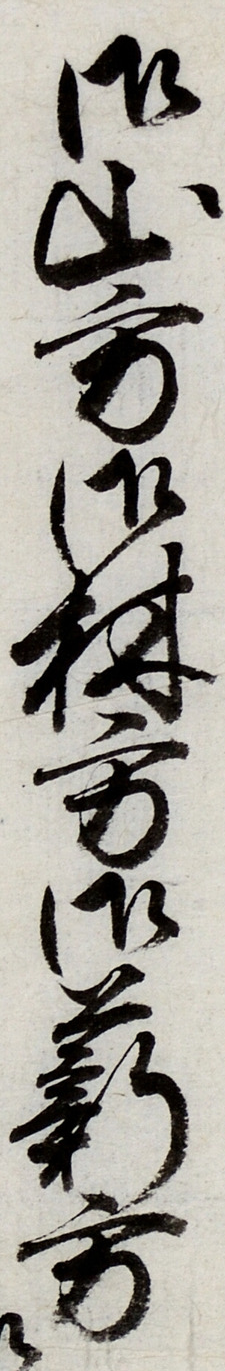御山方御林方御薪方
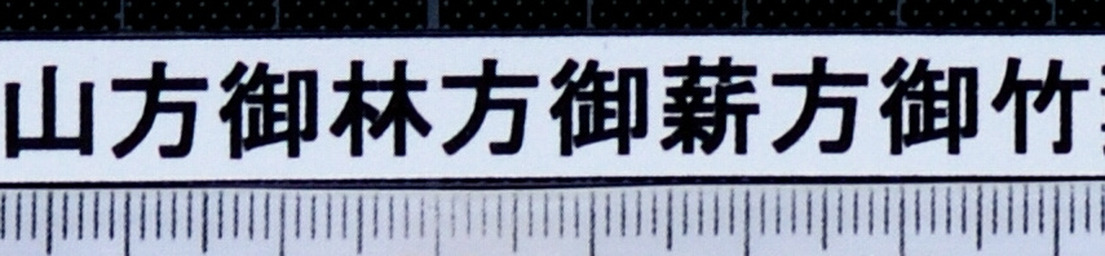御山方御林方御薪方
